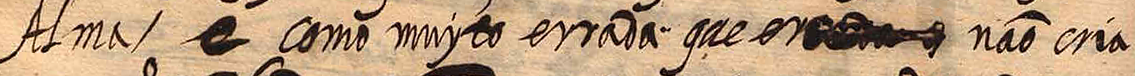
Alma / e como muyto errada que er_ não cria
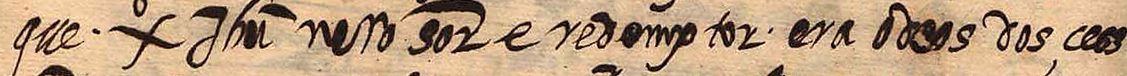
que Xo Jhū nosso s̄or e redemptor era o deos dos ceos
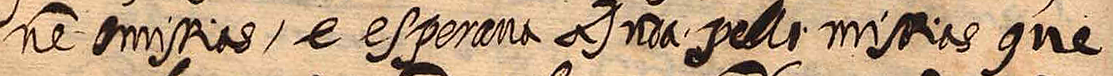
nē o missias / e esperaua aJnda pello missias que
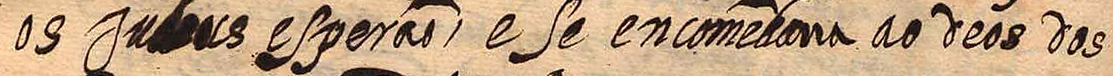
os Judeus esperão / e se encomēdaua ao deos dos
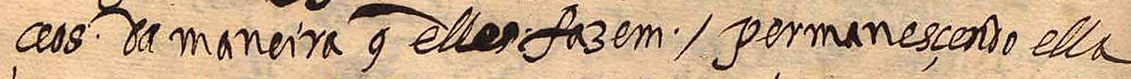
ceos da maneira q̄ elles fazem. / permanescendo ella
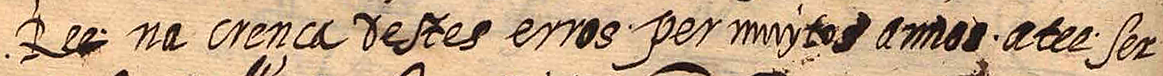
Ree na crença destes erros per muytos annos atee ser
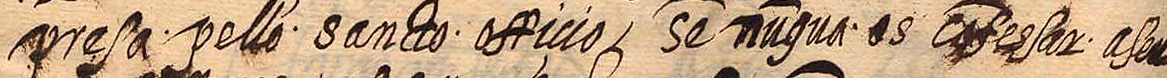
presa pello sancto officio, sē nūqua os cōfessar a seus
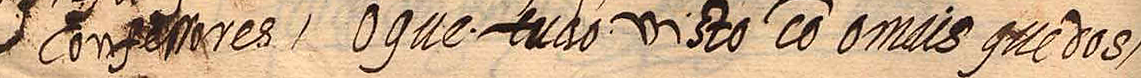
confessores / o que tudo visto cō o mais que dos /
